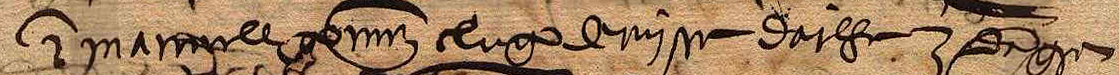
item manuell gomez clerigo de mjssa da jlha 3a dāgra
